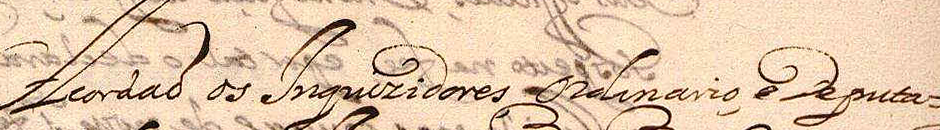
Acordaõ os Inquizidores, Ordinario e Deputa
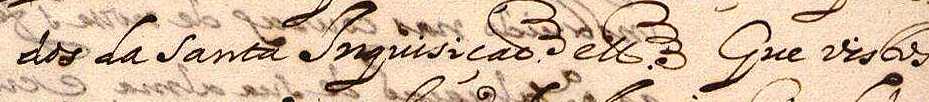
dos da santa Inquisiçaõ ett̄. Que vistos
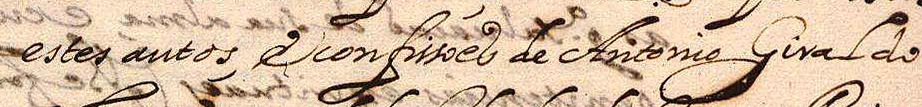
estes autos, e confissoẽs de Antonio Giraldo
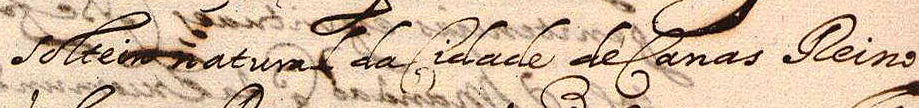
solteiro natural da Cidade de Canas Reino
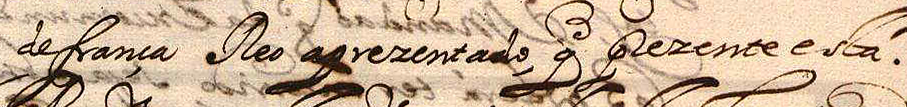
de frança Reo aprezentado, q̄ prezente está.
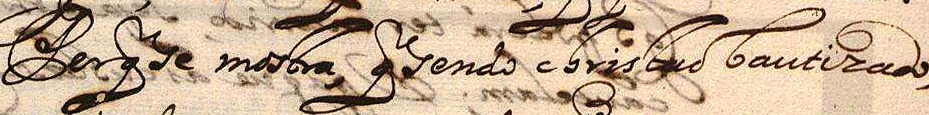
Per q̄ se mostra, q̄ sendo christaõ bautizado,
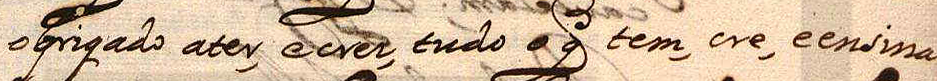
obrigado a ter, e crer, tudo o q̄ tem, cre, e ensina
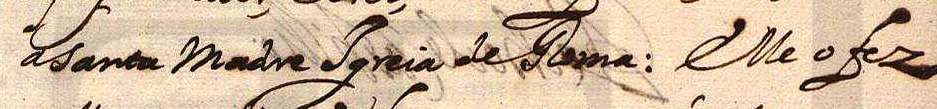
a santa Madre Igreia de Roma: elle o fez
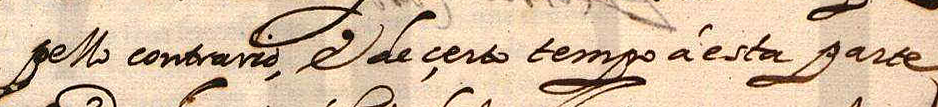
pello contrario, e de certo tempo á esta parte
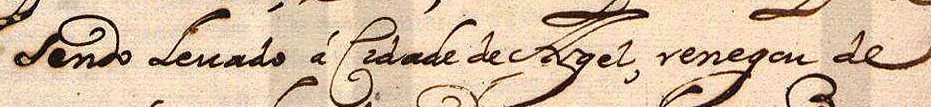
sendo Leuado á Cidade de Argel, renegou de
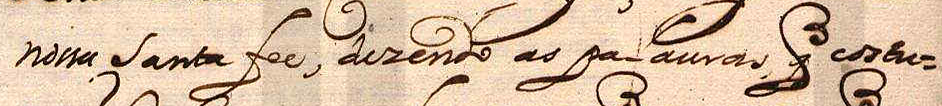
nossa Santa fee, dizendo as palauras, q̄ costu
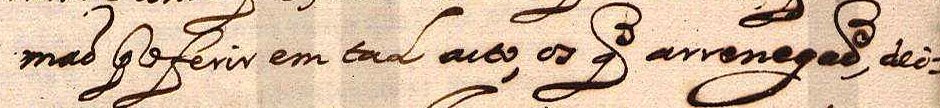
maõ proferir em tal acto, os q̄ arrenegaõ, dei
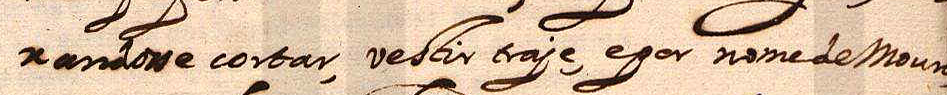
xandosse cortar, vestir traje, e por nome de mouro,
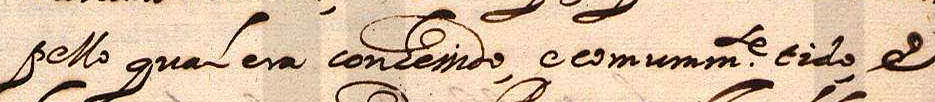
pello qual era conhessido, e comumm.te tido, e
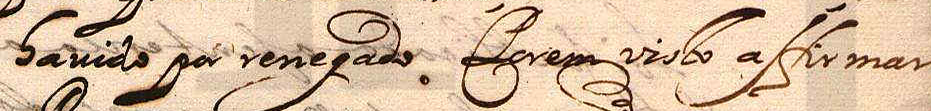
hauido por renegado Porem visto affirmar
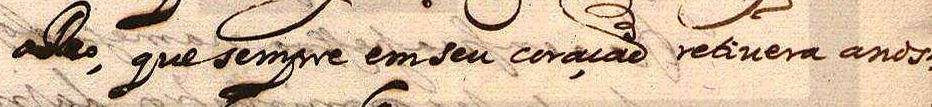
o Reo, que sempre em seu coraçaõ retiuera a nos
